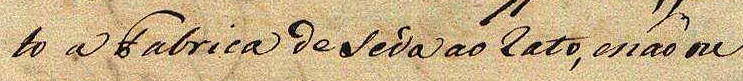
to a Fabrica de seda ao Rato, e naõ ou
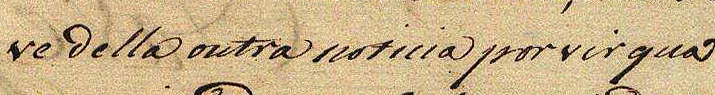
ve della outra noticia por vir qua
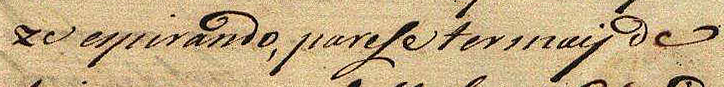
ze espirando, parese ter mais de
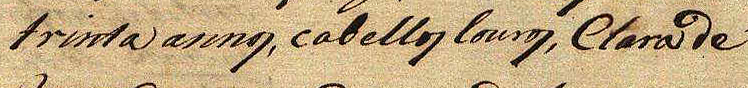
trinta annos, cabellos louros, Clara de
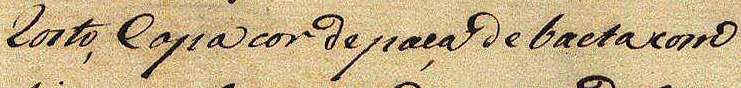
Rosto, Capa cor de paça de baeta com
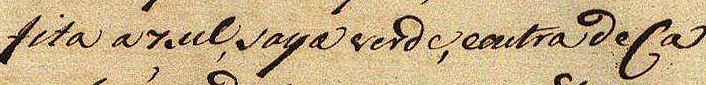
fita azul, saya verde, e outra de Ca
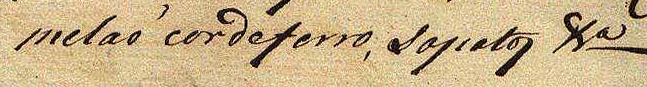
melaõ cor de ferro, sapatos &a
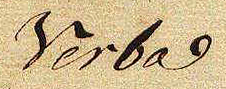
Verba
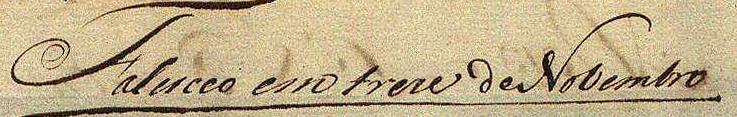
Faleceo em treze de Novembro
